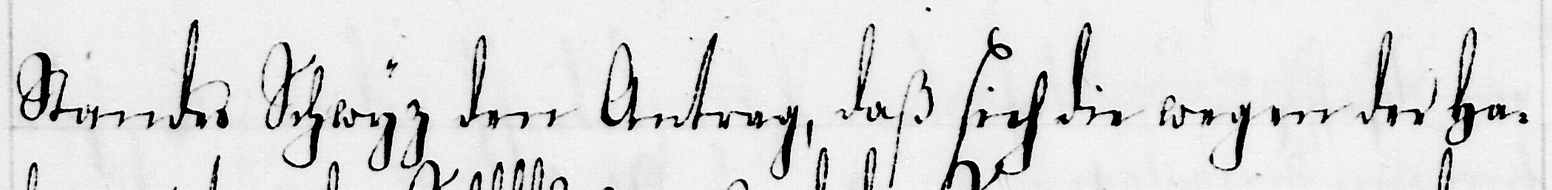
Standes Schwyz den Antrag, daß sich die wegen der Haf¬
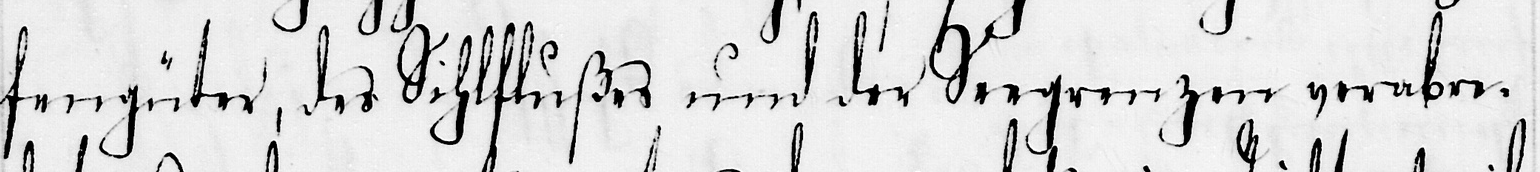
engüter, des Sihlflußes und der Seegrenzen verabre¬
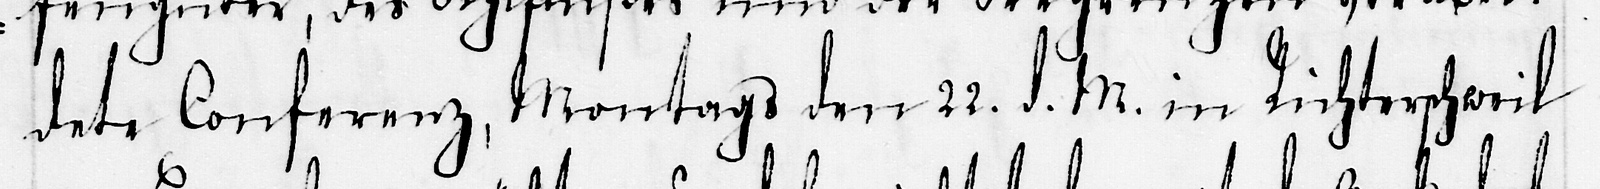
dete Conferenz, Montags den 22. d. M. in Richterschweil
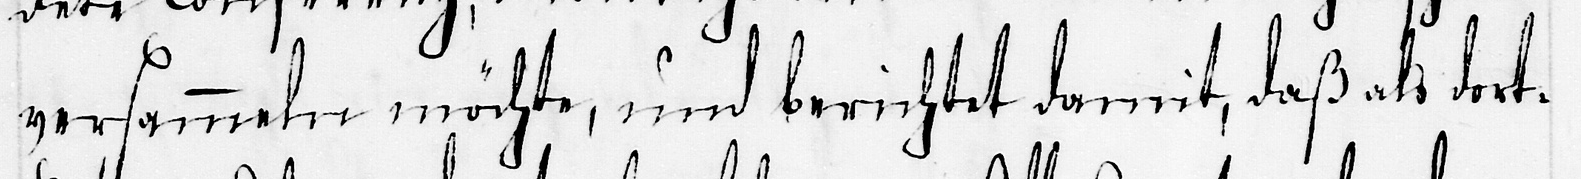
versammeln möchte, und berichtet damit, daß als dort¬
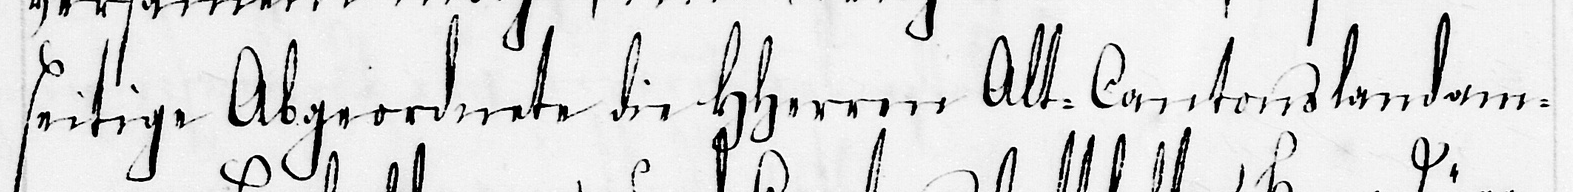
seitige Abgeordnete die HHerren Alt-Cantonslandam¬
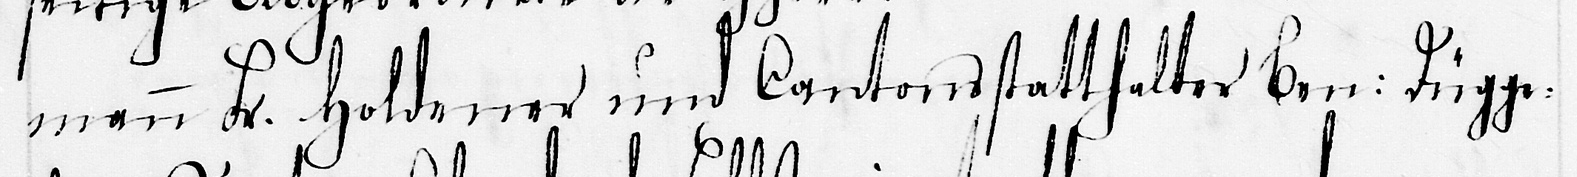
mann Fr. Holdener und Cantonsstatthalter Ben. Dügge¬
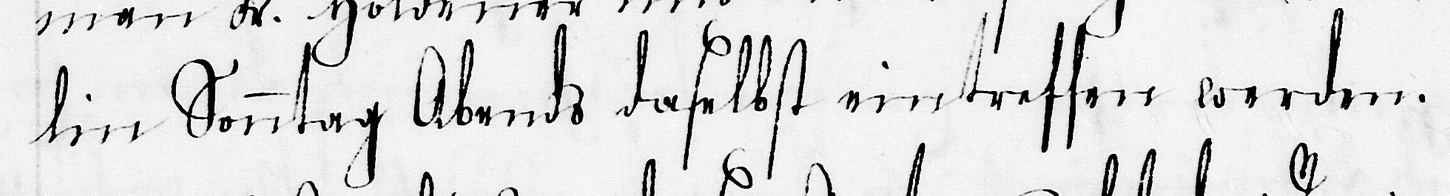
lin Sonntag Abends daselbst eintreffen werden.
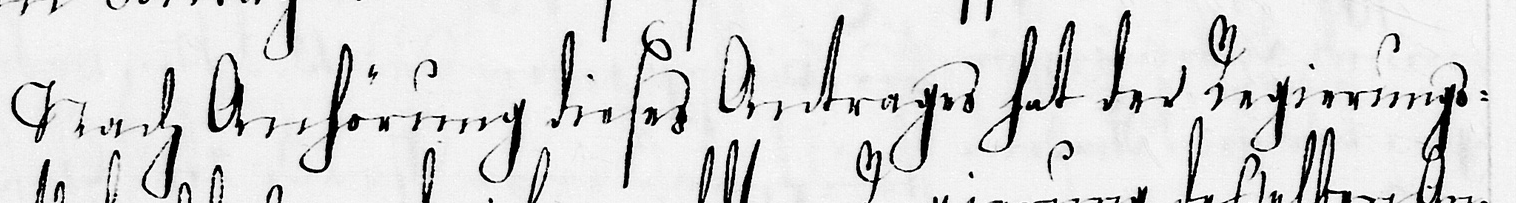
Nach Anhörung dieses Antrages hat der Regierungs¬
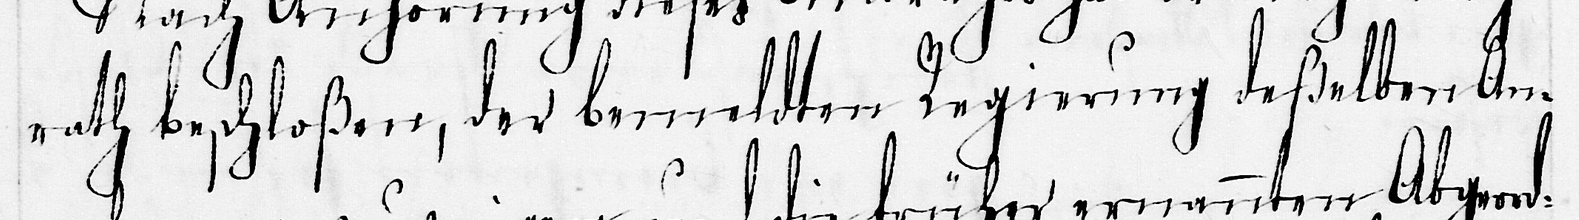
rath beschloßen, der bemeldten Regierung deßelben An¬
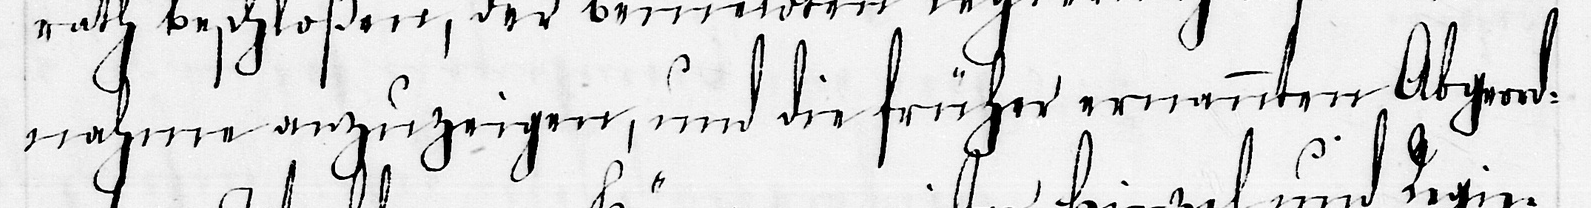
nahme anzuzeigen, und die früher ernannten Abgeord¬
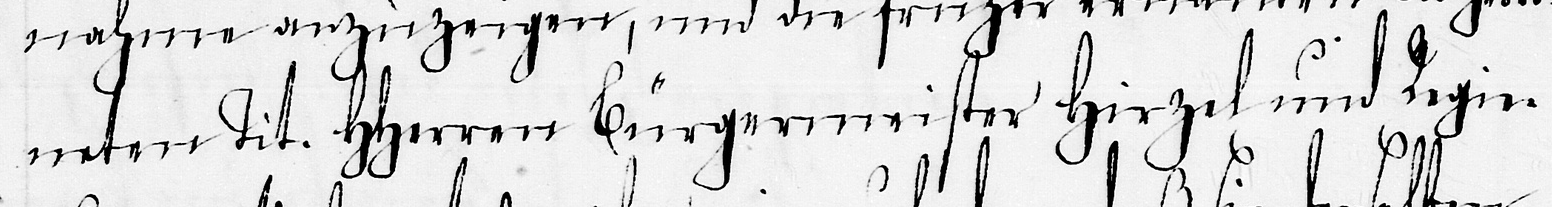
neten Tit. HHerren Bürgermeister Hirzel und Regie¬
